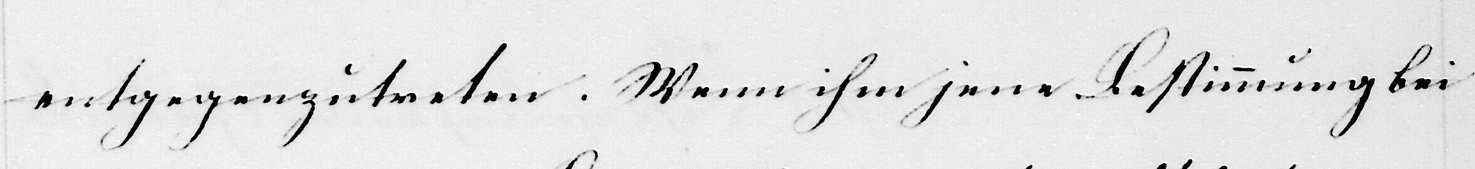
entgegenzutreten. Wenn ihm jene Bestimmung bei
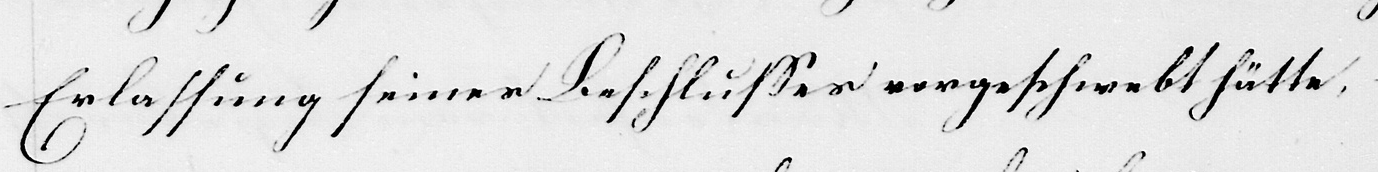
Erlassung seines Beschlußes vorgeschwebt hätte,
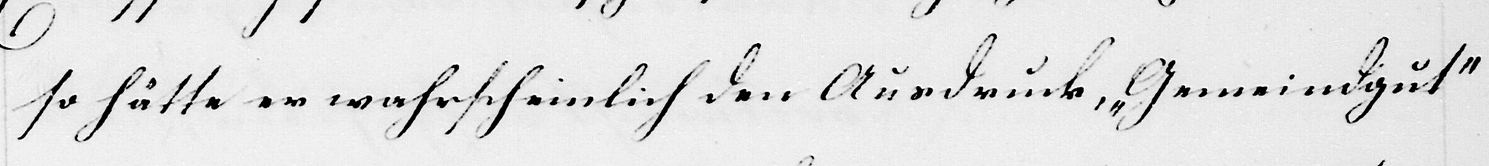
so hätte er wahrscheinlich den Ausdruck, „Gemeindgut“
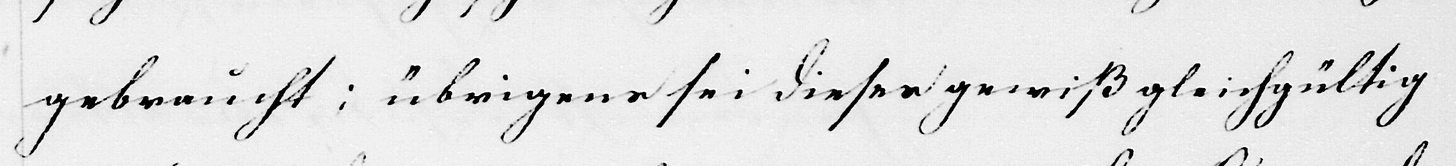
gebraucht; übrigens sei dieses gewiß gleichgültig
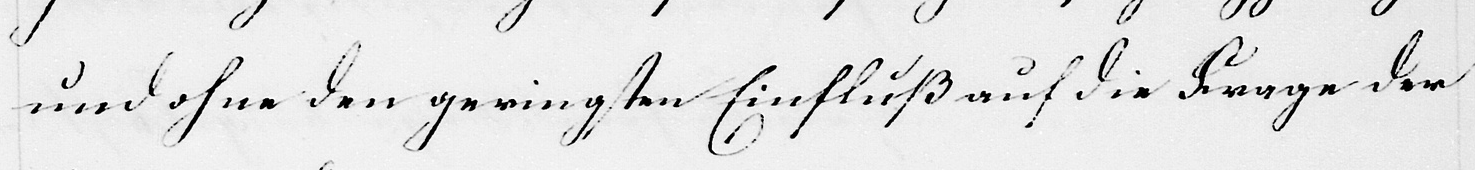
und ohne den geringsten Einfluß auf die Frage der
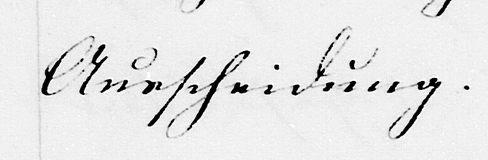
Ausscheidung.
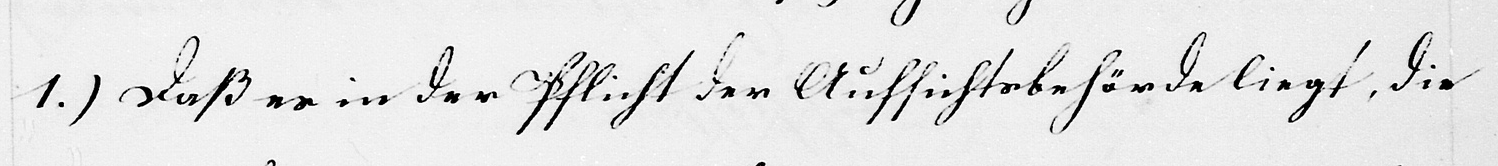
1.) Daß es in der Pflicht der Aufsichtsbehörde liegt, die
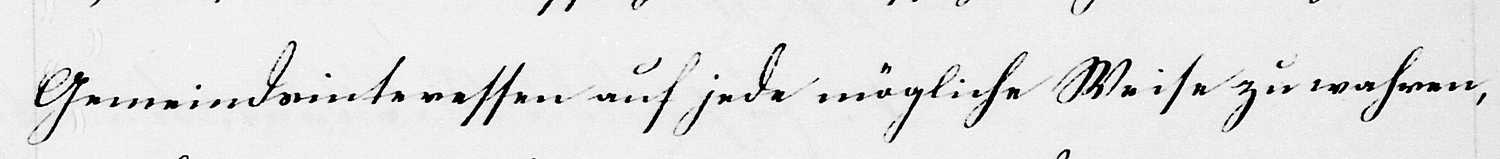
Gemeindsinteressen auf jede mögliche Weise zu wahren,
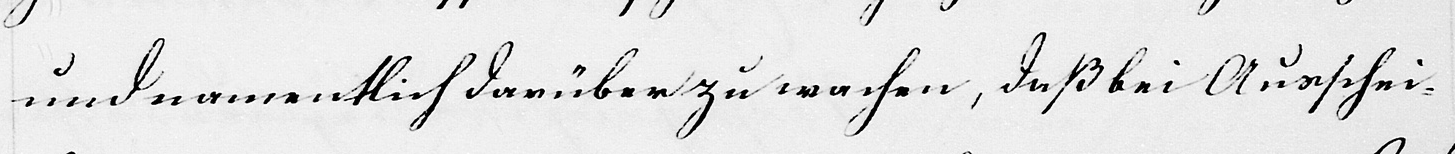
und namentlich darüber zu wachen, daß bei Ausschei¬
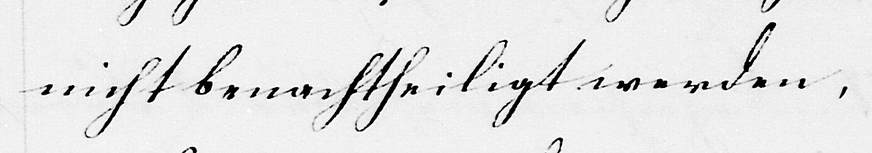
nicht benachtheiligt werden.
